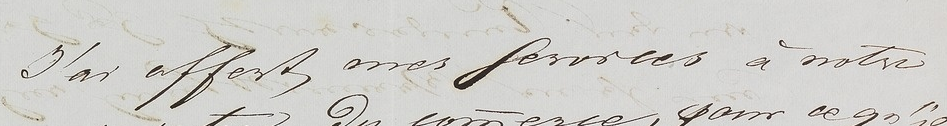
J'ai offert mes services à notre
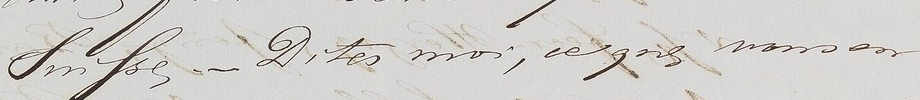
Suisse. – Dites moi, ce que vous en
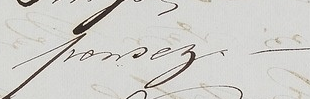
pensez. –
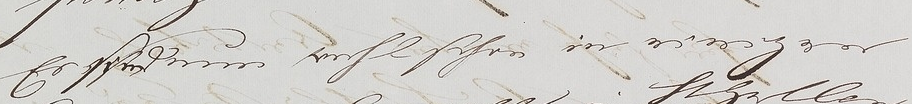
Es sind nun wohl schon in einigen
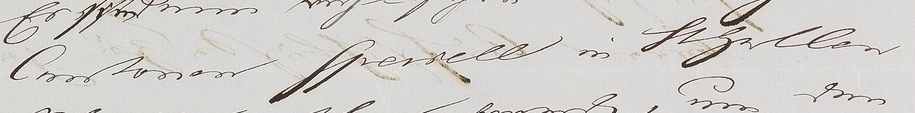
Cantonen speciell in St. Gallen
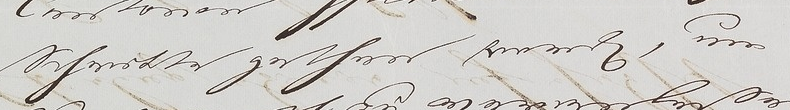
Schritte gethan worden, um den
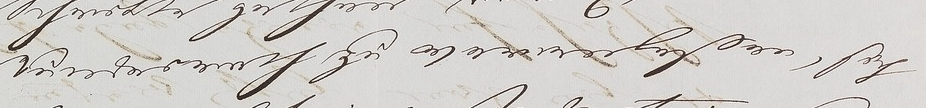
Bundesrath zu veranlassen, sich
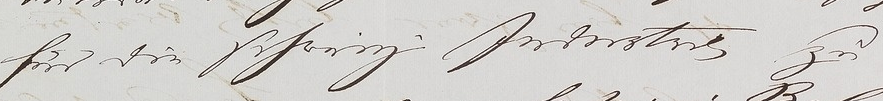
für die schweiz. Industrie zu
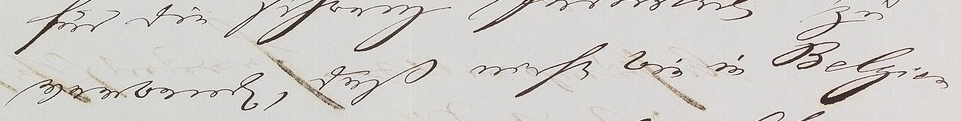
verwenden, daß nicht wie in Belgien
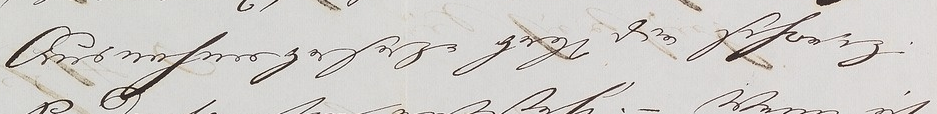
Ausnahmsgeseze gegen die schweiz.
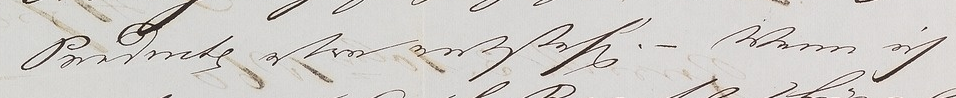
Producte etwa entstehen. – Wenn ich
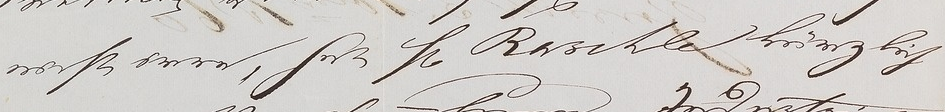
nicht irre, hat Herr Raschle kürzlich
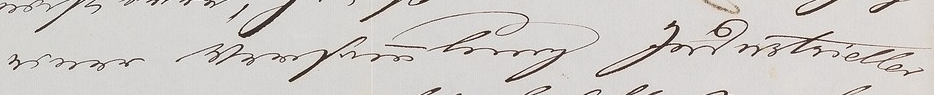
einer Versammlung Industrieller
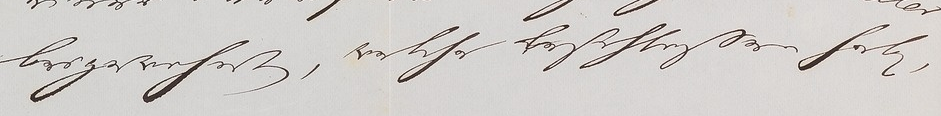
beigewohnt, welche beschlossen haben,
